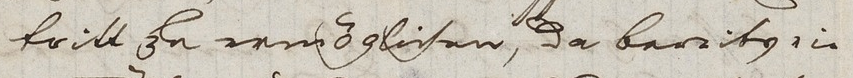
tritt zu ermöglichen, da bereits ei-
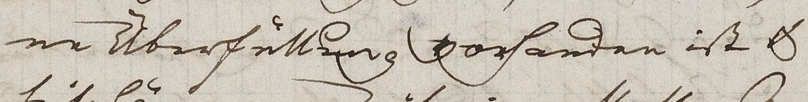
ne Überfüllung vorhanden ist &
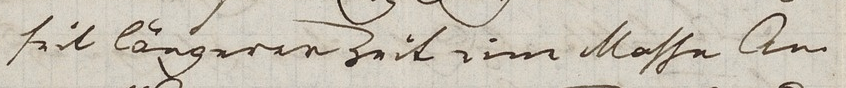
seit längerer Zeit eine Masse An-
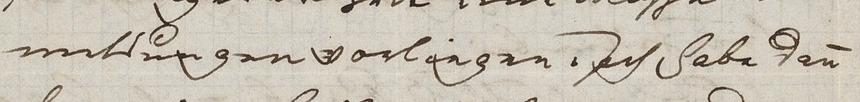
meldungen vorliegen. Ich habe dann
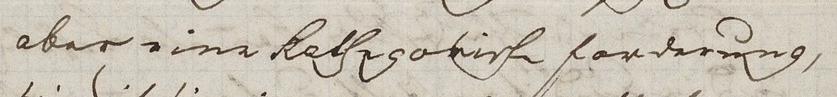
aber eine kathegorische Forderung,
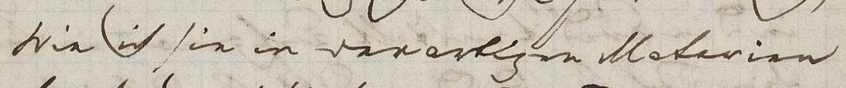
wie ich sie in derartigen Materien
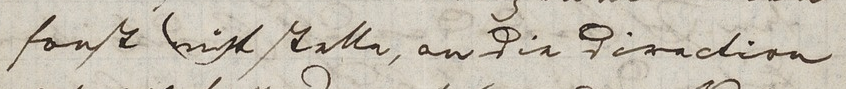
sonst nicht stelle, an die Direction
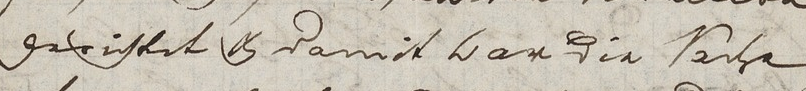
gerichtet & damit war die Sache
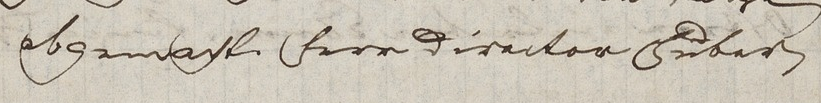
abgemacht. Herr Director Huber
